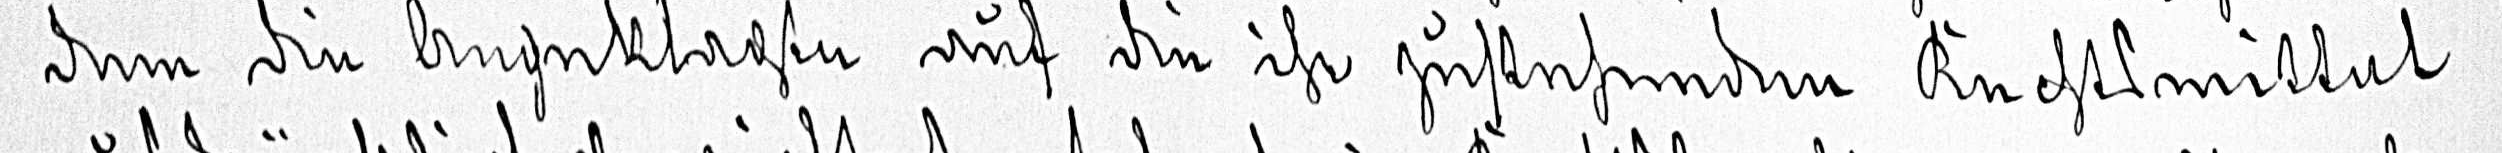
dem die Angeklagte auf die ihr zustehenden Rechtsmittel
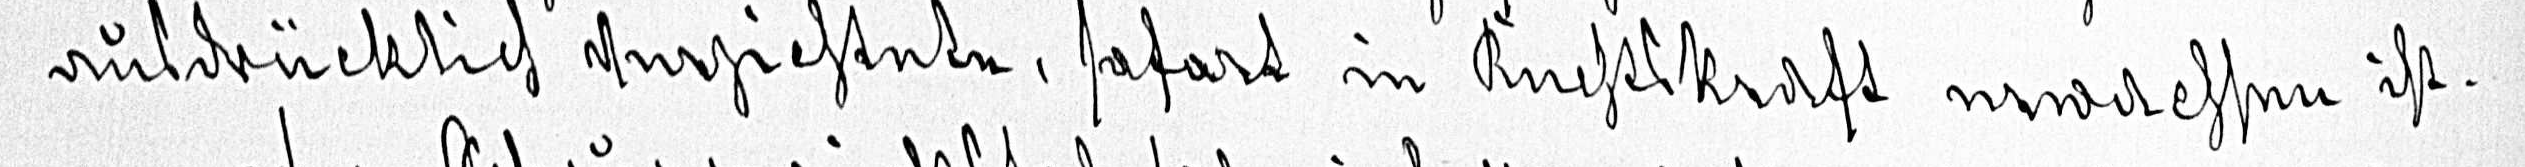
ausdrücklich verzichtete, sofort in Rechtskraft erwachsen ist.
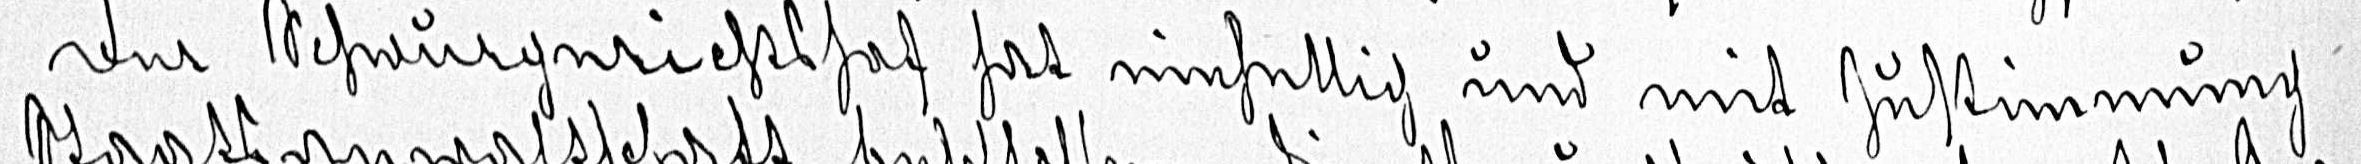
Der Schwurgerichtshof hat einhellig und mit Zustimmung
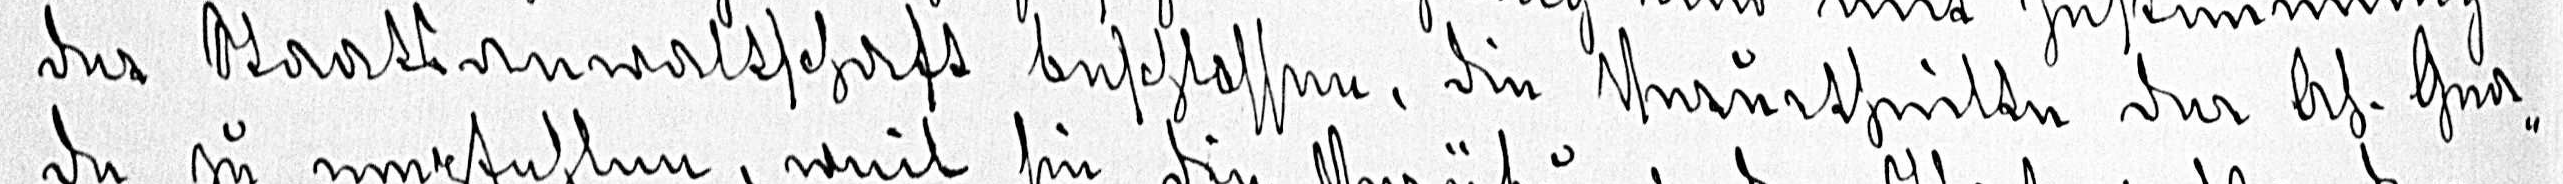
der Staatsanwaltschaft beschlossen, die Verurtheilte der Ah. Gna¬
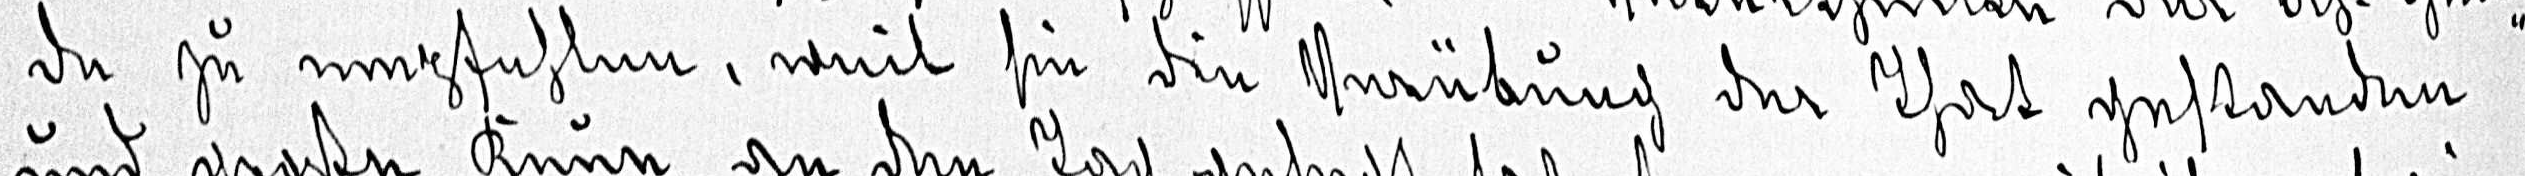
de zu empfehlen, weil sie die Verübung der That gestanden
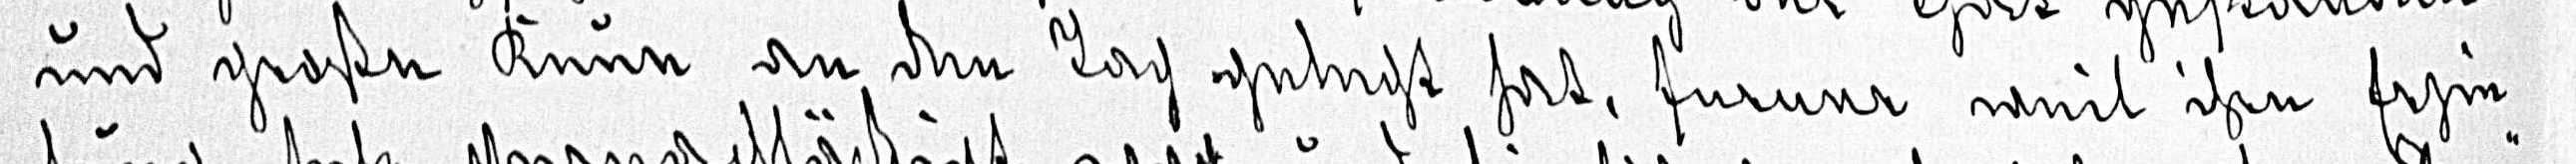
und große Reue an den Tag gelegt hat, ferner weil ihre Erzie¬
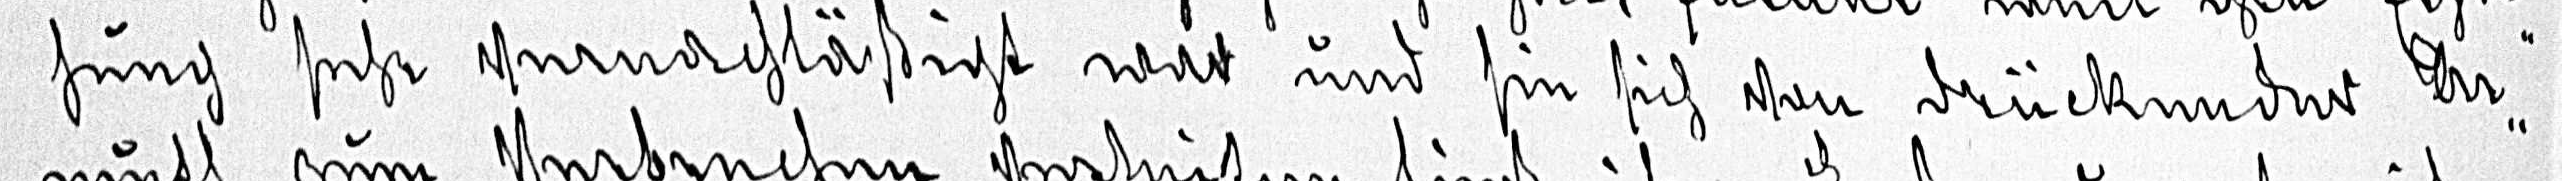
hung sehr vernachlässigt war und sie sich von drückender Ar¬
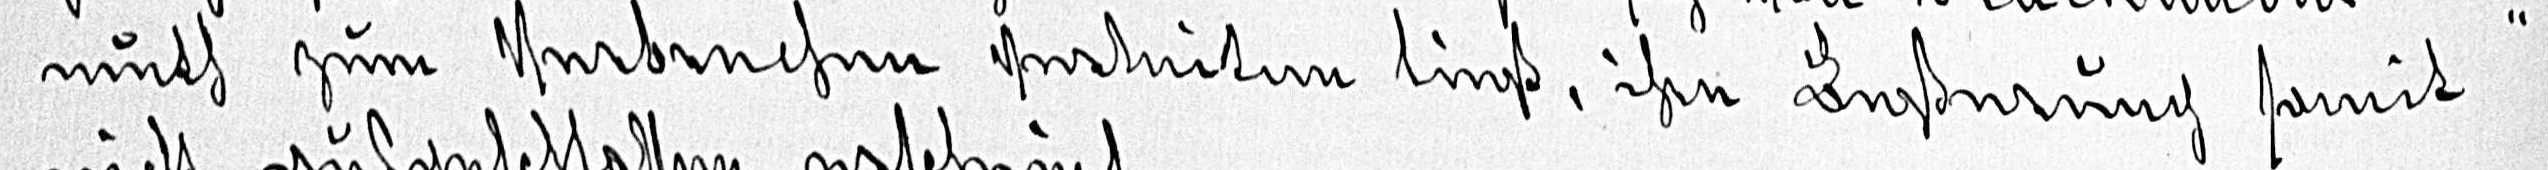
muth zum Verbrechen verleiten ließ, ihre Beßerung somit
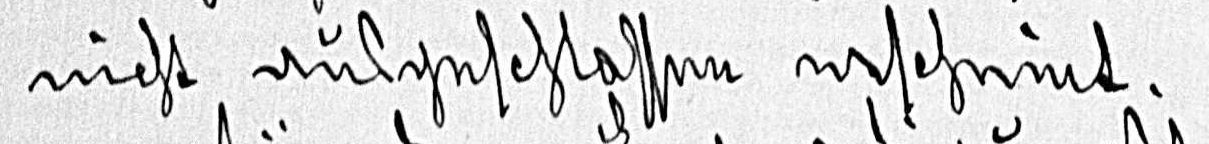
nicht ausgeschlossen erscheint.
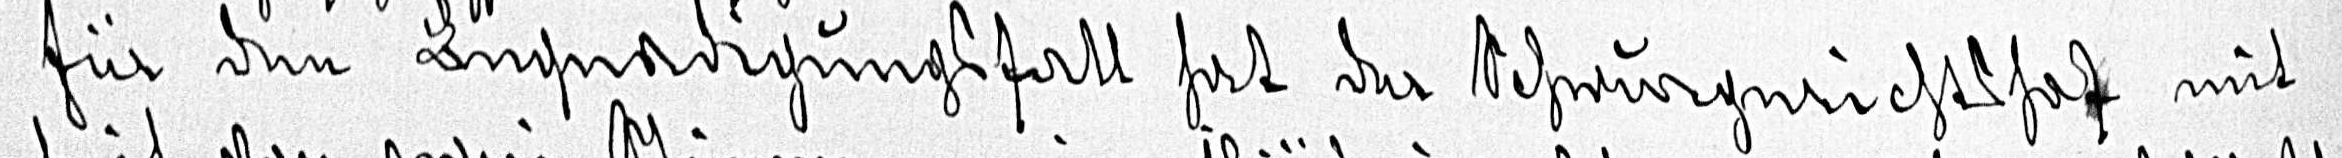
Für den Begnadigungsfall hat der Schwurgerichtshof mit
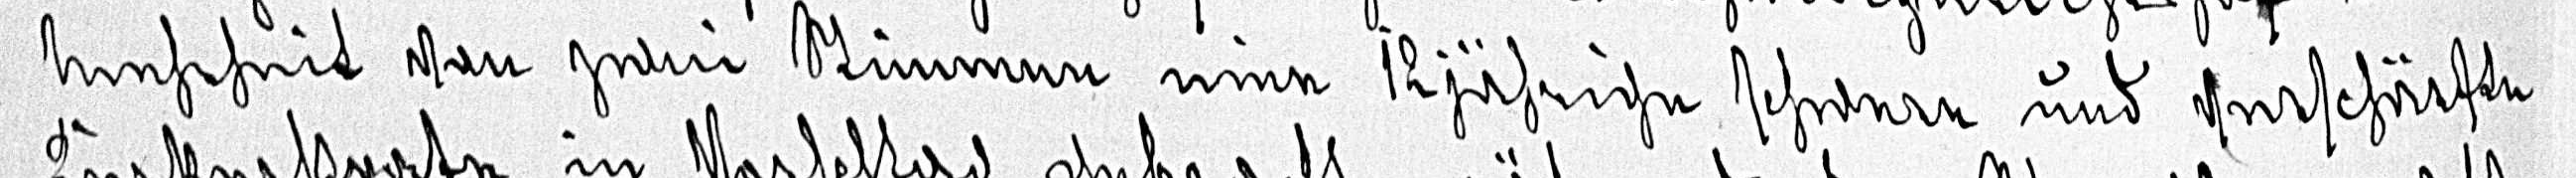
Mehrheit von zwei Stimmen eine 12jährige schwere und verschärfte
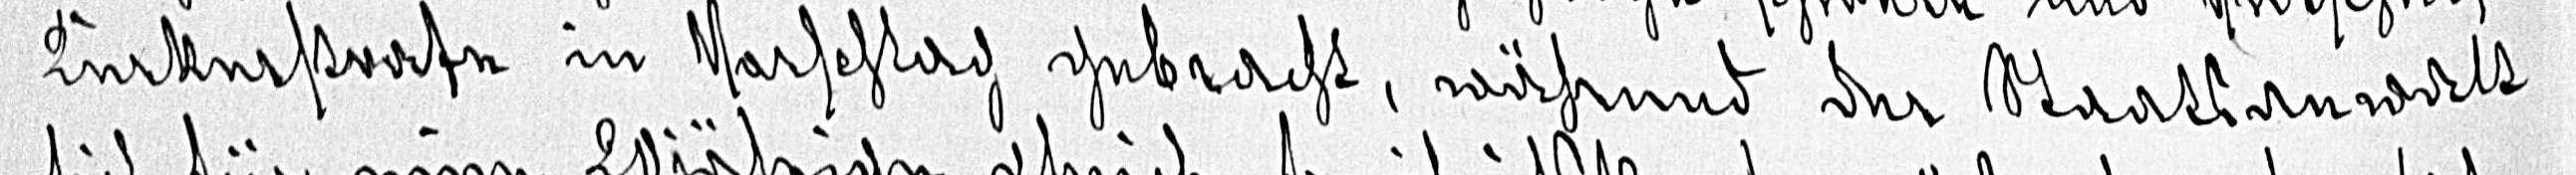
Kerkerstrafe in Vorschlag gebracht, während der Staatsanwalt
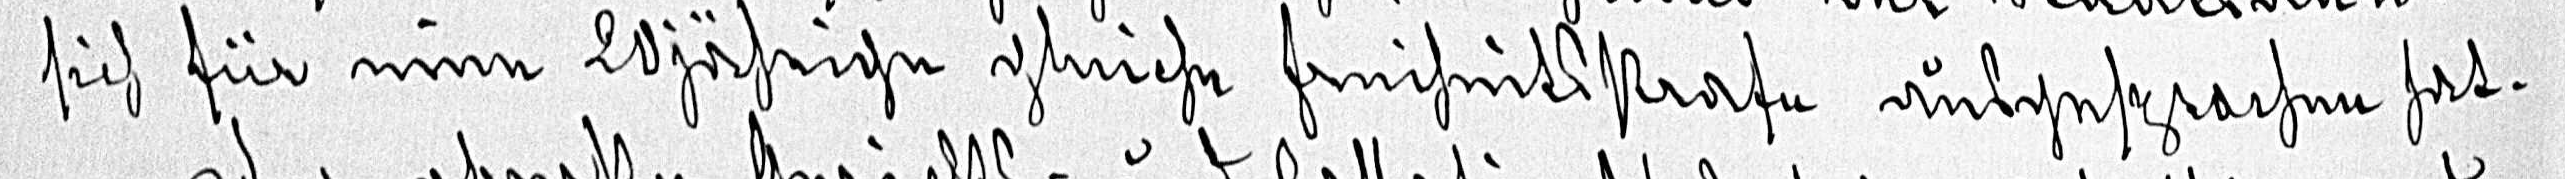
sich für eine 20jährige gleiche Freiheitsstrafe ausgesprochen hat.
